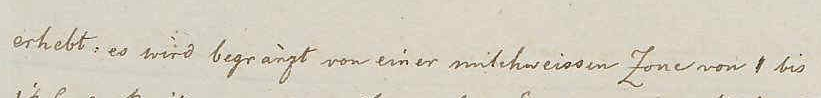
erhebt: es wird begränzt von einer milchweissen Zone von 1 bis
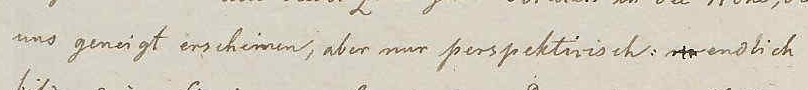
uns geneigt erscheinen, aber nur perspektivisch: mendlich
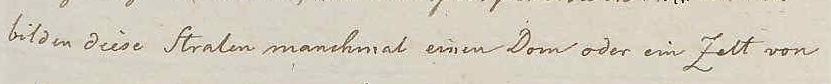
bilden diese Stralen manchmal einen Dom oder ein Zelt von
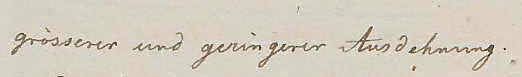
grösserer und geringerer Ausdehnung.
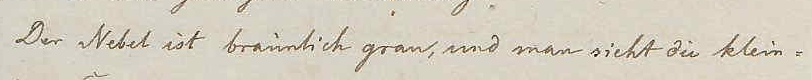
Der Nebel ist bräunlich grau, und man sieht die klein-
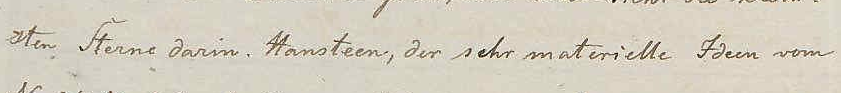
sten Sterne darin. Hansteen, der sehr materielle Ideen vom
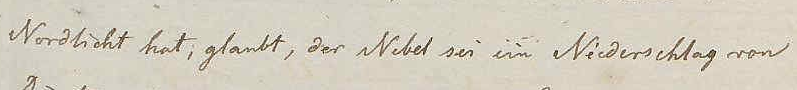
Nordlicht hat, glaubt, der Nebel sei ein Niederschlag von
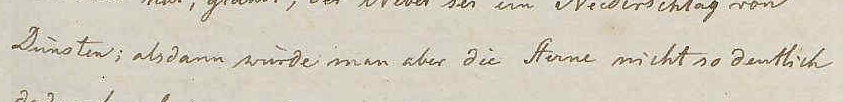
Dünsten; alsdann würde man aber die Sterne nicht so deutlich
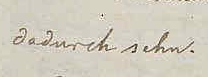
dadurch sehn.
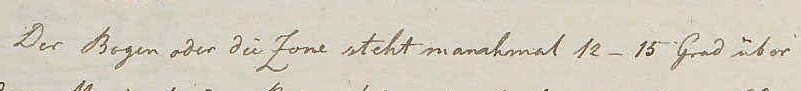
Der Bogen oder die Zone steht manchmal 12–15 Grad über
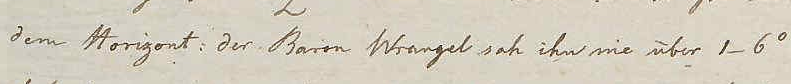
dem Horizont: der Baron Wrangel sah ihn nie über 1–6°
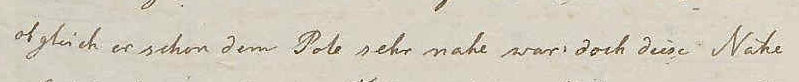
obgleich er schon dem Pole sehr nahe war: doch diese Nähe
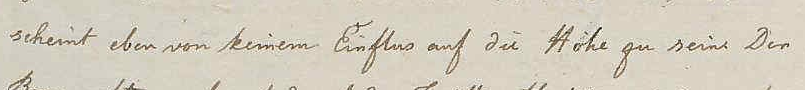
scheint eben von keinem Einflus auf die Höhe zu sein. Der
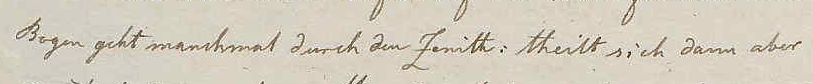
Bogen geht manchmal durch den Zenith: theilt sich dann aber
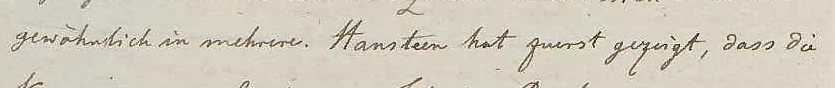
gewöhnlich in mehrere. Hansteen hat zuerst gezeigt, dass die
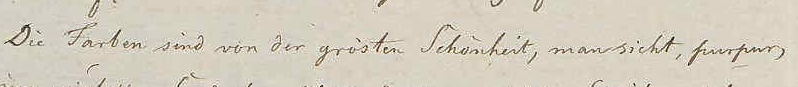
Die Farben sind von der grösten Schönheit, man sieht, purpur,
